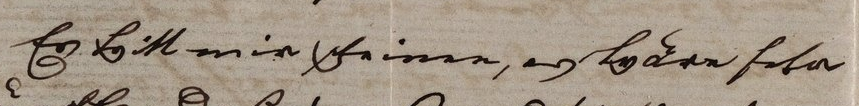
Es will mir scheinen, es wäre sehr
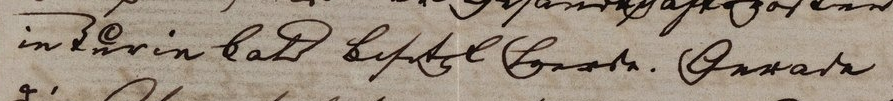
in Turin bald besetzt werde. Gerade
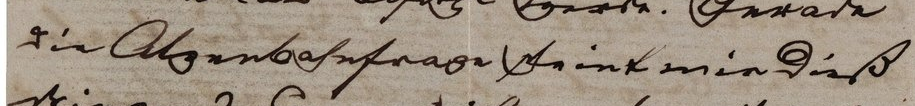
die Alpenbahnfrage scheint mir dieß
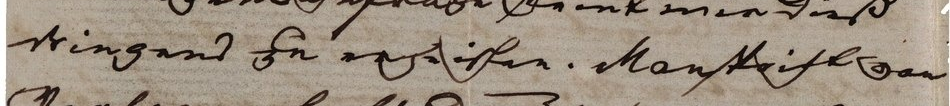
dringend zu erheischen. Man spricht von
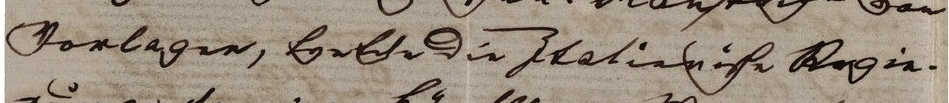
Vorlagen, welche die Italienische Regie-
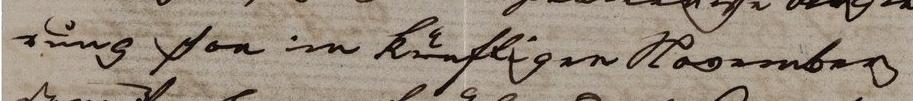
rung schon im künftigen November
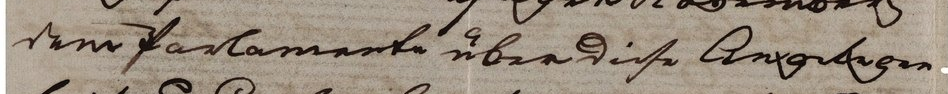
dem Parlamente über diese Angelegen-
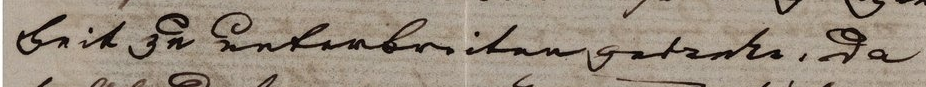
heit zu unterbreiten gedenke. Da
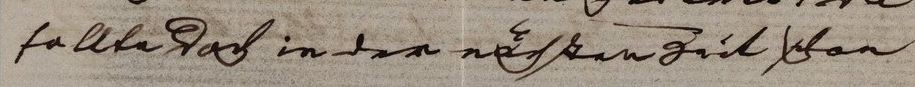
sollte doch in der nächsten Zeit schon
